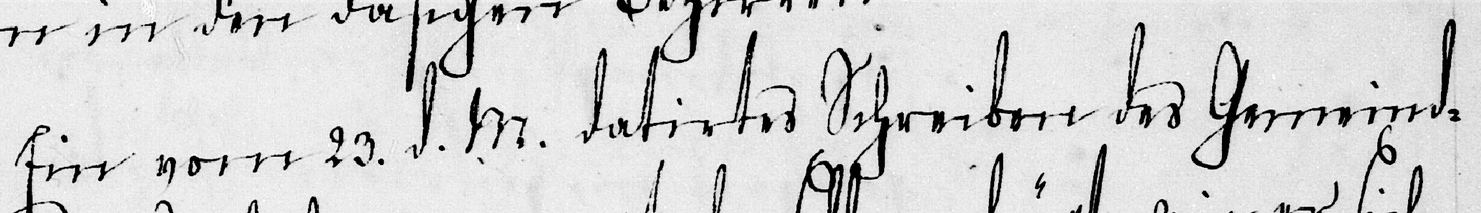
Ein vom 23. d. M. datirtes Schreiben des Gemeind¬
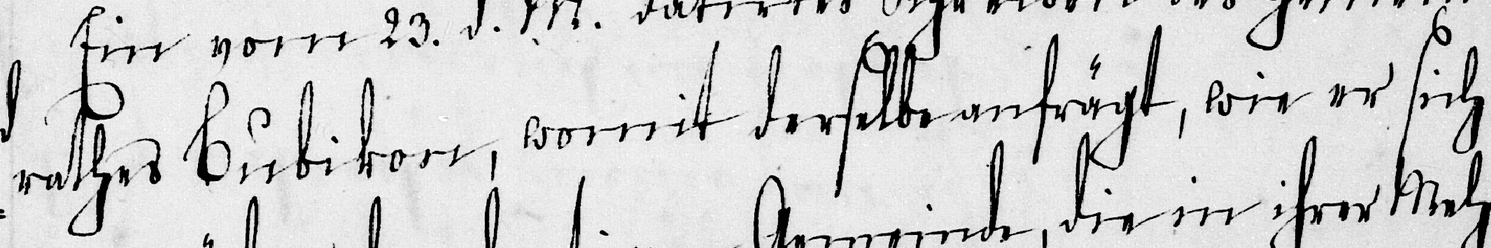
rathes Bubikon, womit derselbe anfrägt, wie er sich
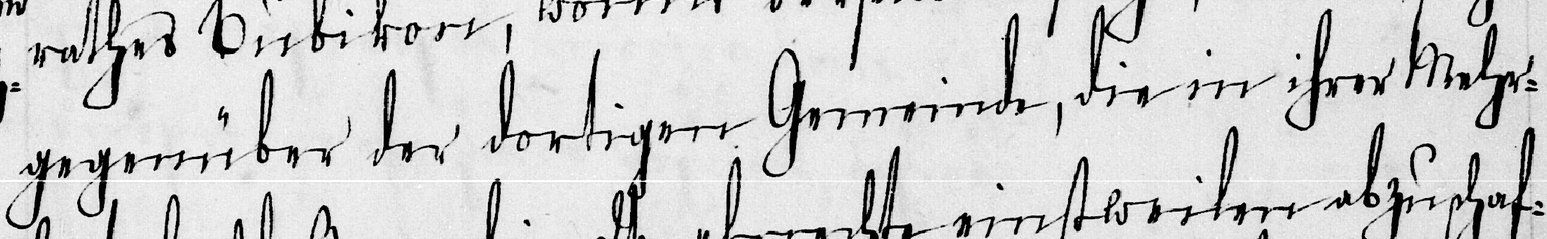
gegenüber der dortigen Gemeinde, die in ihrer Mehr¬
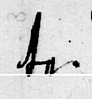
fe¬
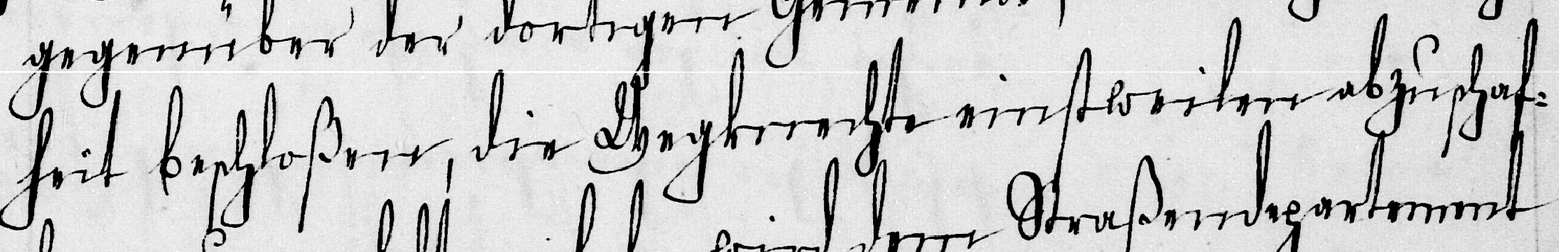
heit beschloßen, die Wegknechte einstweilen abzuschaf¬
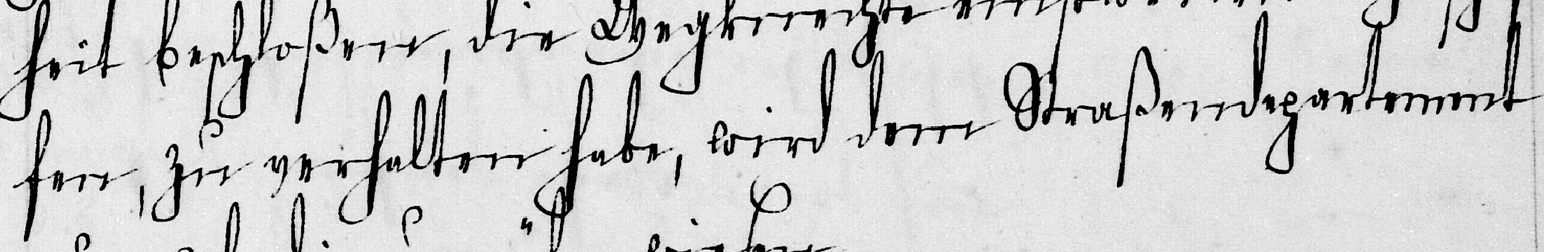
fen, zu verhalten habe, wird dem Straßendepartement
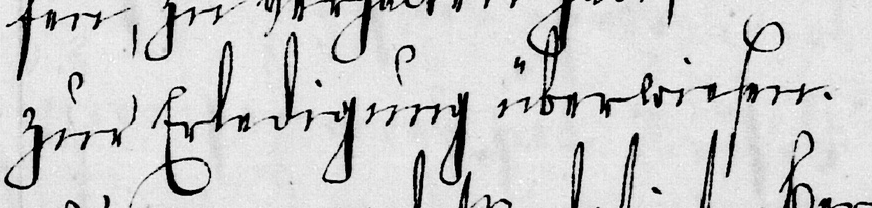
zur Erledigung überwiesen.
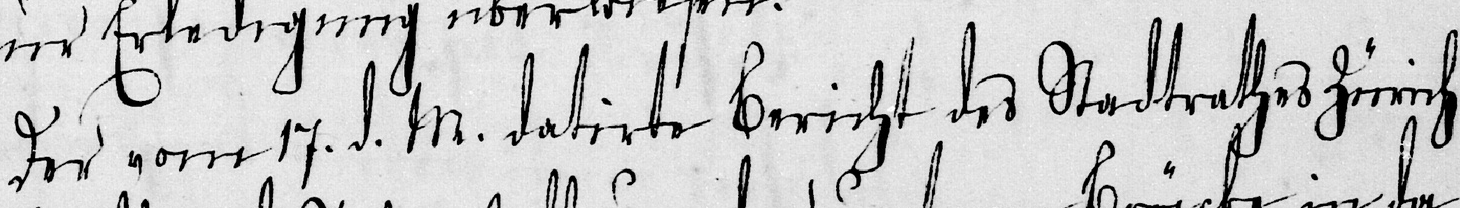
Der vom 17. d. M. datirte Bericht des Stadtrathes Zür¬
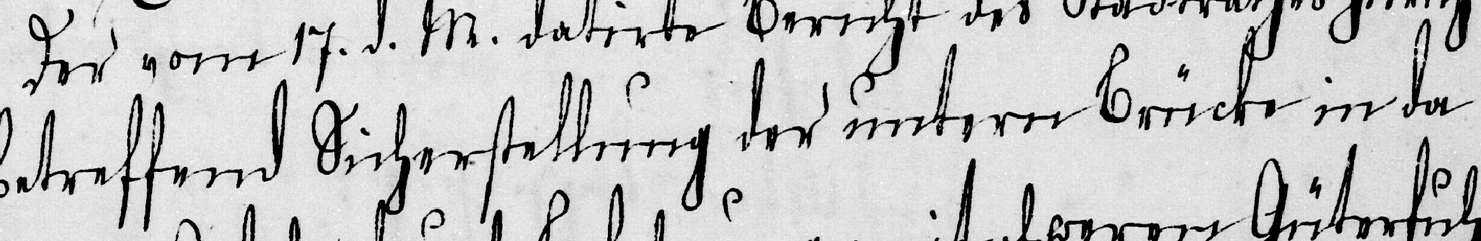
betreffend Sicherstellung der untern Brücke in da
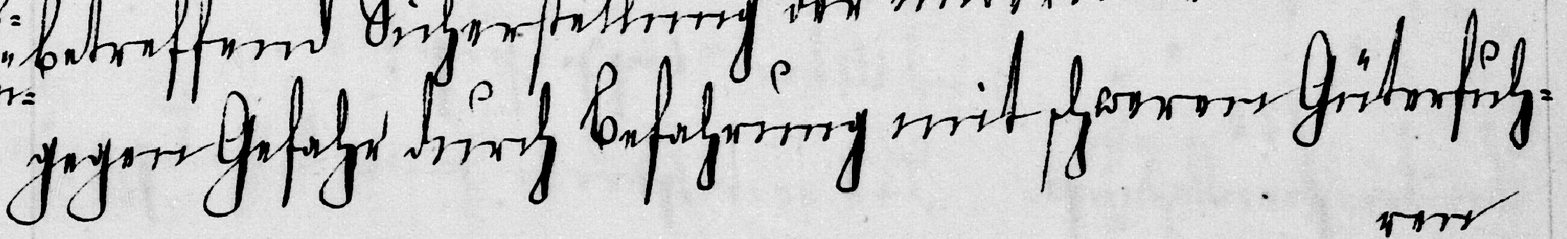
gegen Gefahr durch Befahrung mit schweren Güterfuh-
